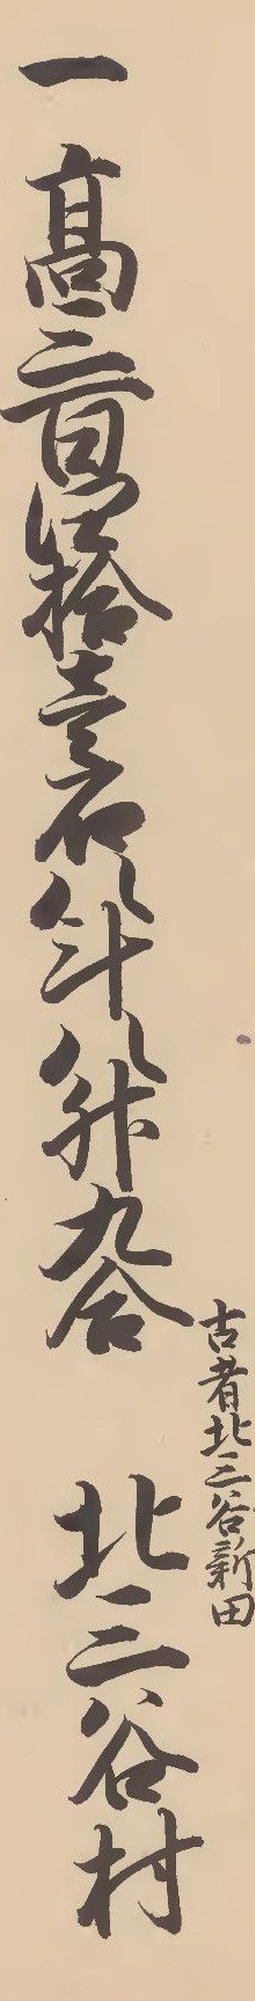一高三百四拾壱石八斗八升九合北三谷村
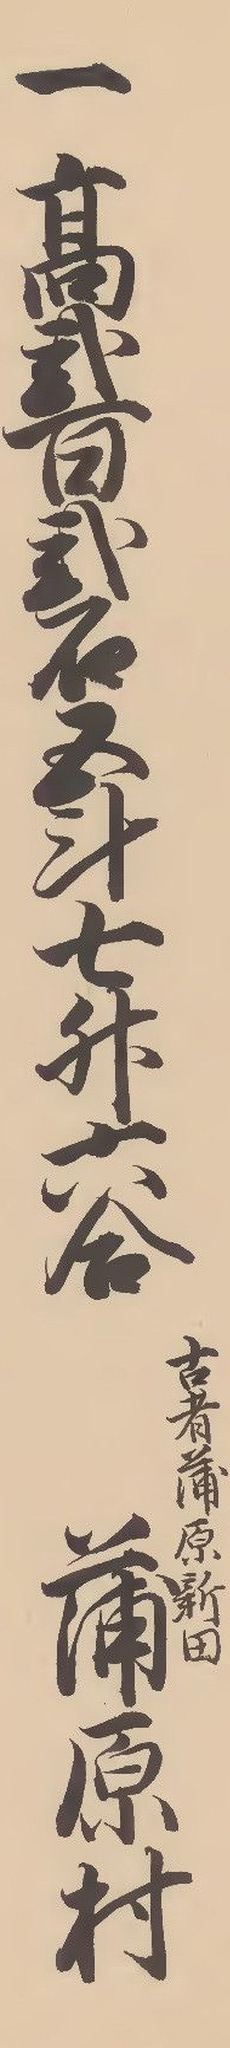一高弐百弐石五斗七升六合蒲原村
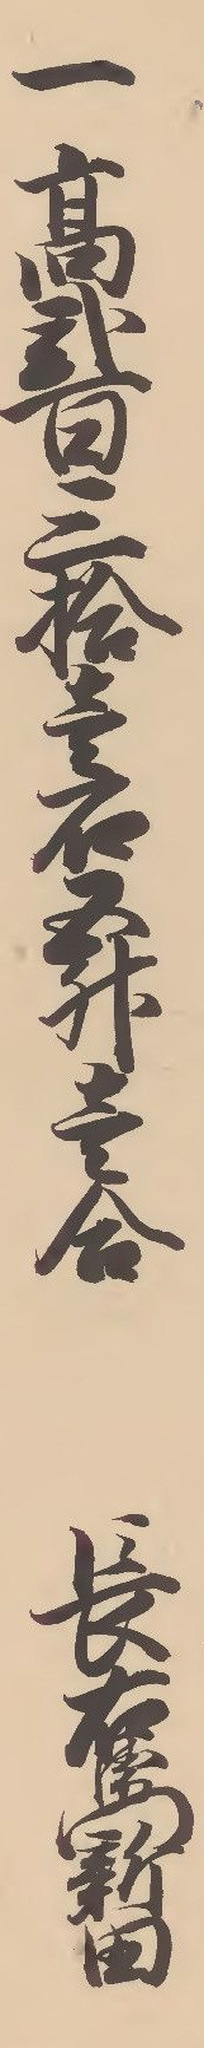一高弐百三拾壱石五升壱合長右衛門新田
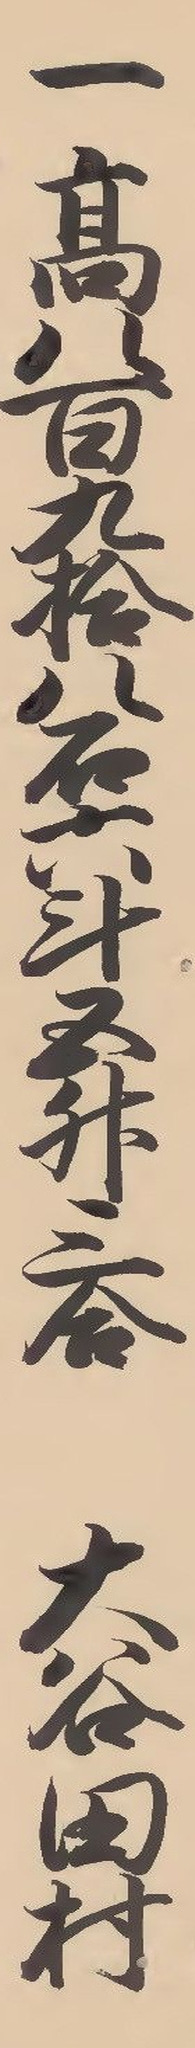一高八百九拾八石六斗五升三合大谷田村
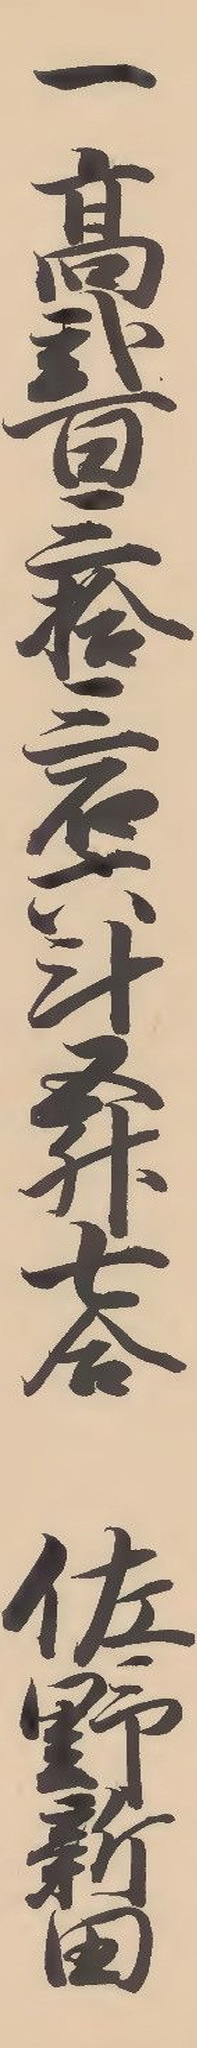一高弐百三拾三石六斗五升七合佐野新田
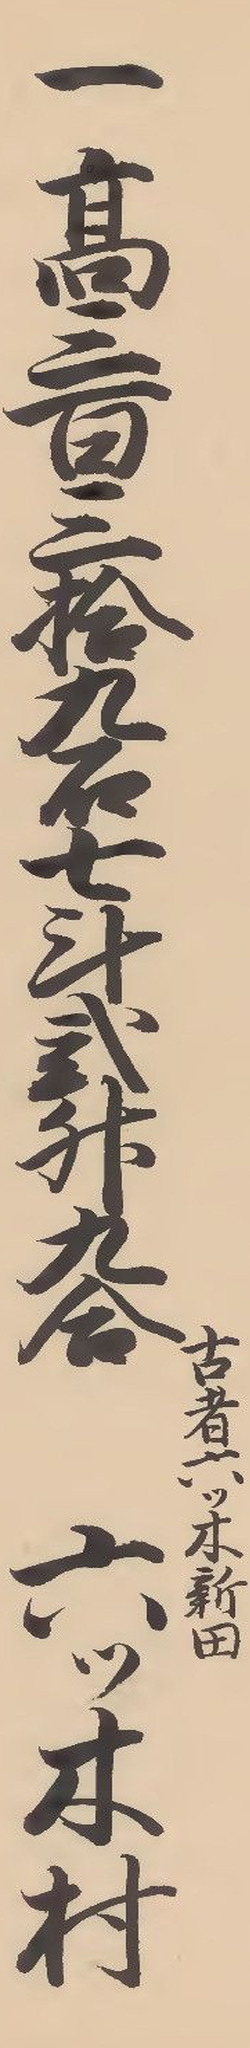一高三百三拾九石七斗弐升九合六ッ木村
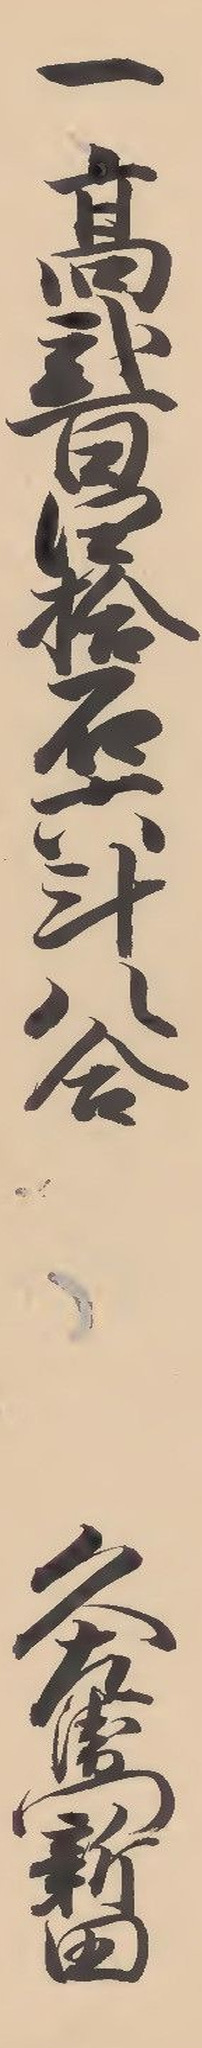一高弐百四拾石六斗八合久左衛門新田

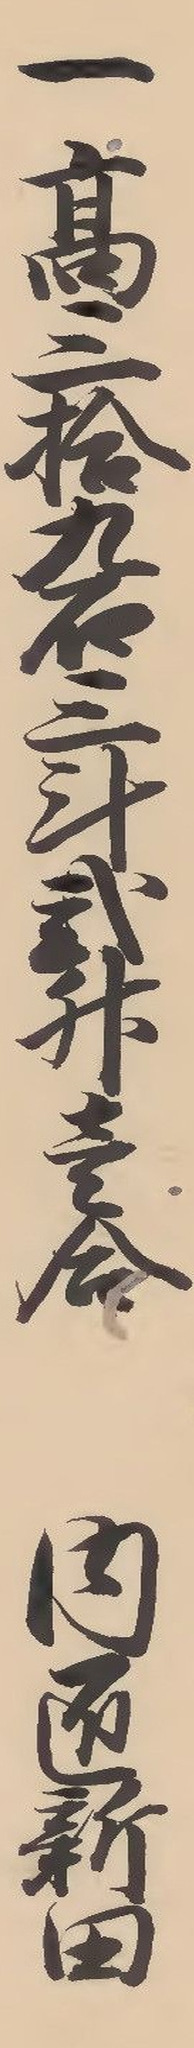一高三拾九石三斗弐升壱合内匠新田
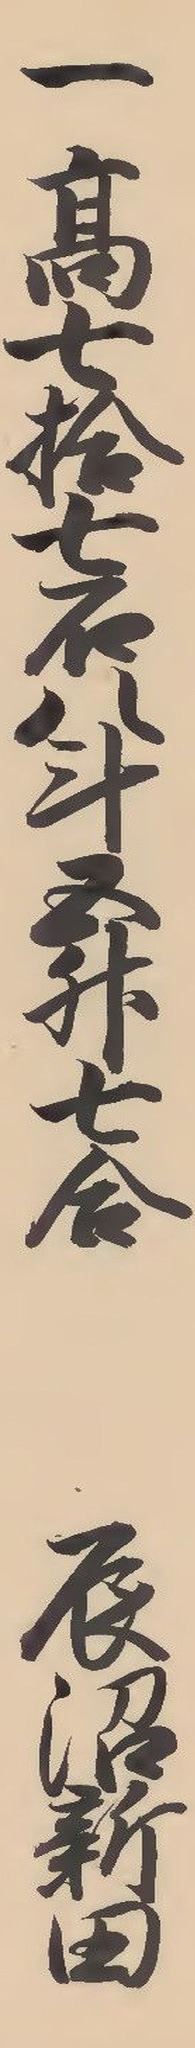一高七拾七石八斗五升七合辰沼新田
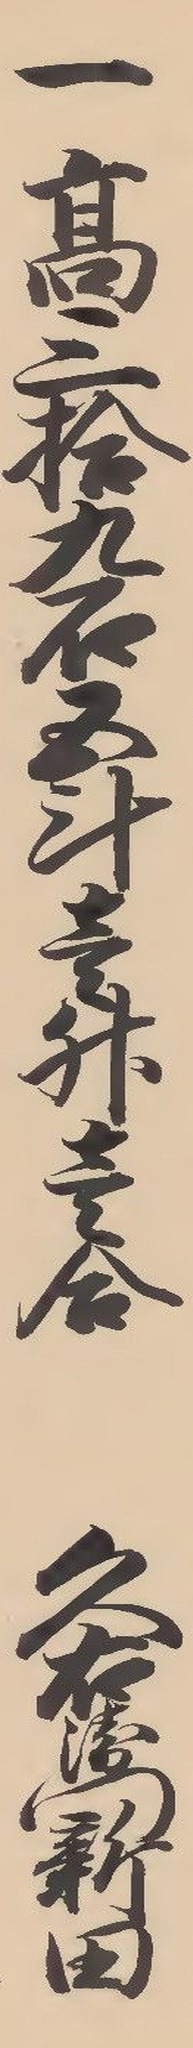一高三拾九石五斗壱升壱合久右衛門新田
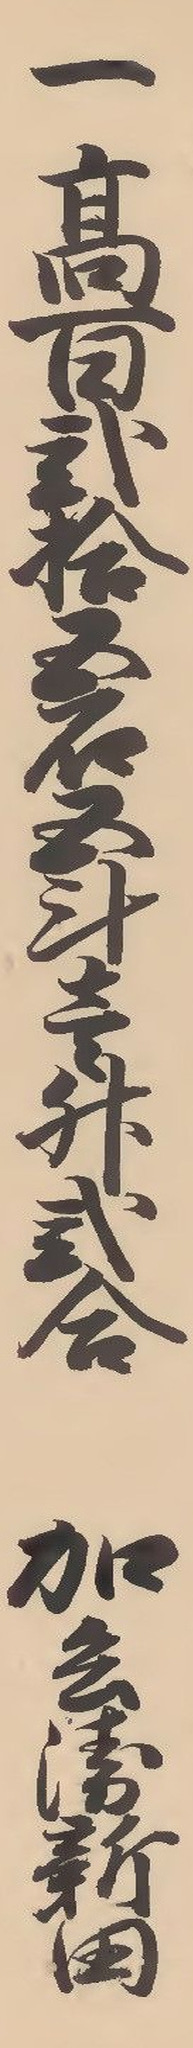一高百弐拾五石五斗壱升弐合加嘉兵衛新田
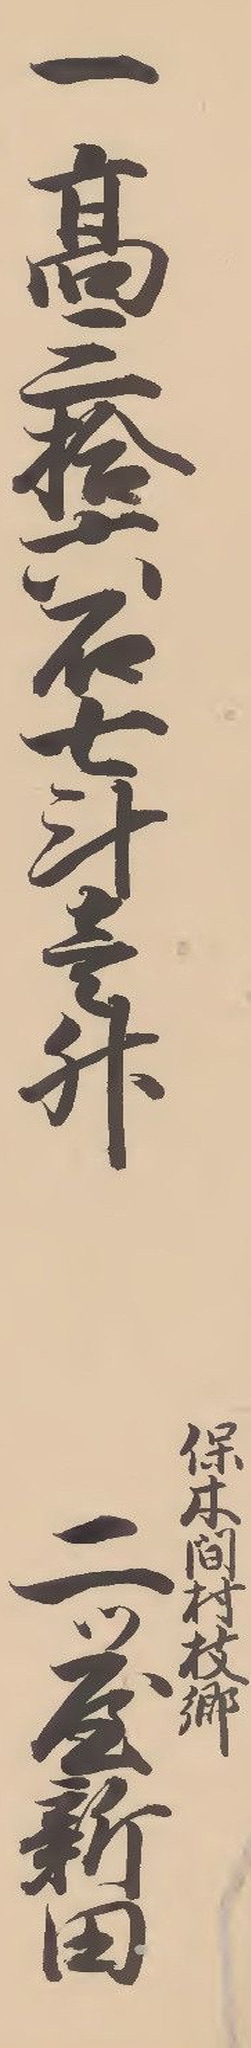一高三拾六石七斗壱升二ツ屋新田
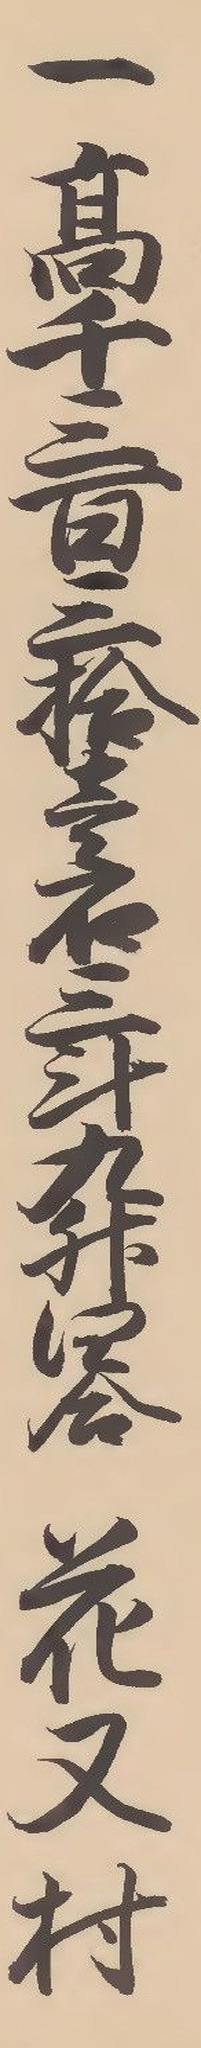一高千三百三拾壱石三斗九升四合花又村
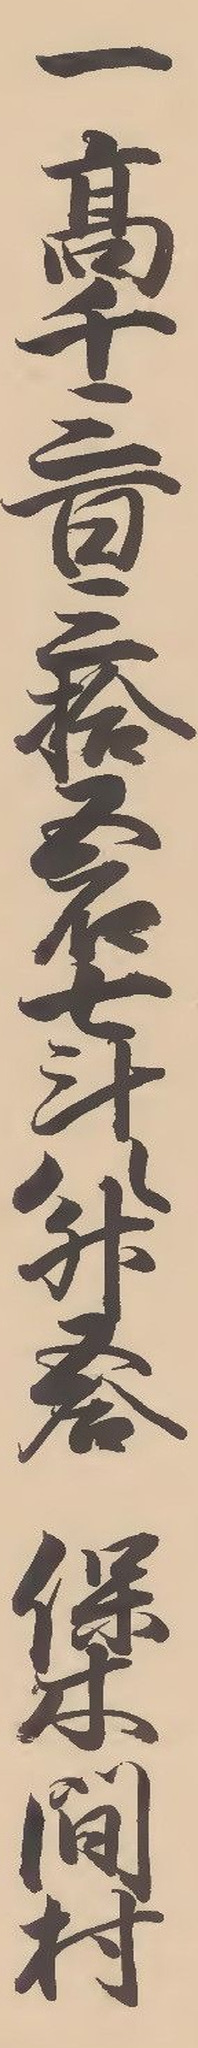一高千三百三拾五石七斗八升五合保木間村
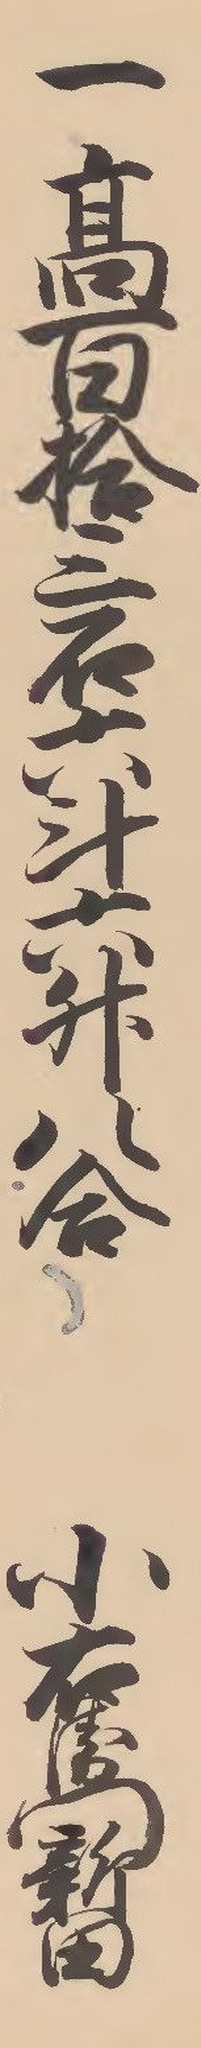一高百拾三石六斗六升八合小右衛門新田

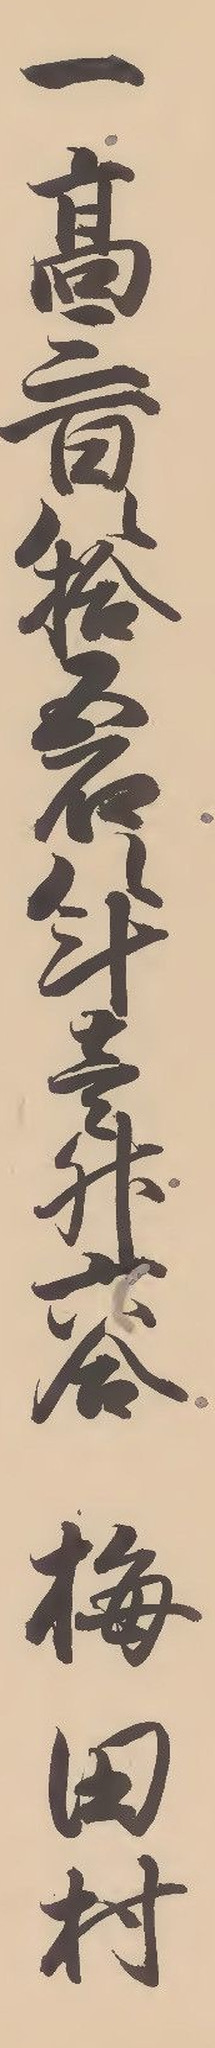一高三百八拾五石八斗壱升六合梅田村
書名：武蔵国郷帳　下
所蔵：国立公文書館 National Archives of Japan
